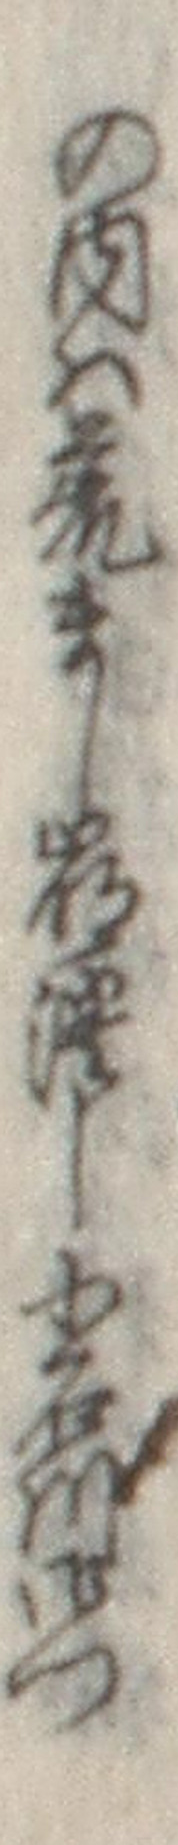の内は荒まし崩潰し小石川御門
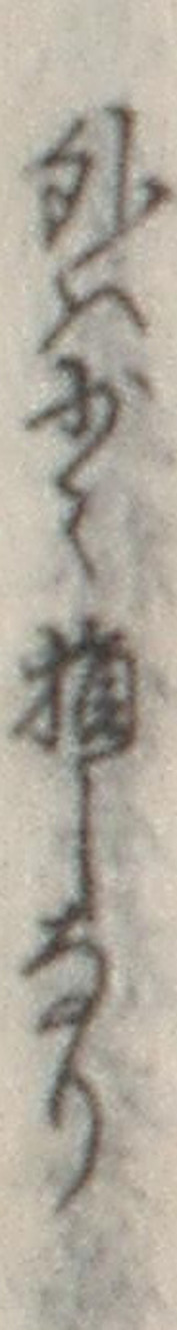外は少〻損しなり
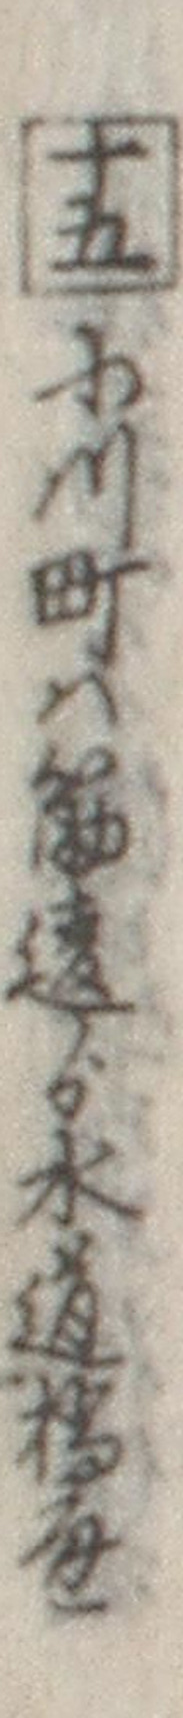十五小川町は筋違ゟ水道橋通
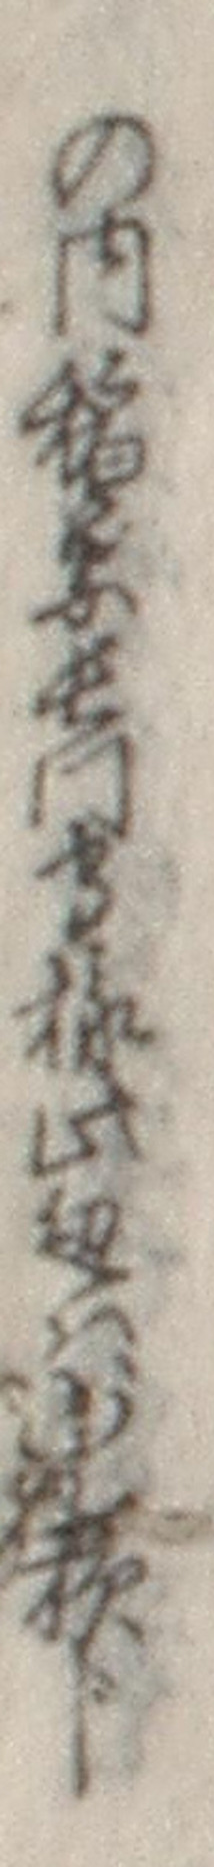の内稲葉長門守様此辺は小損し
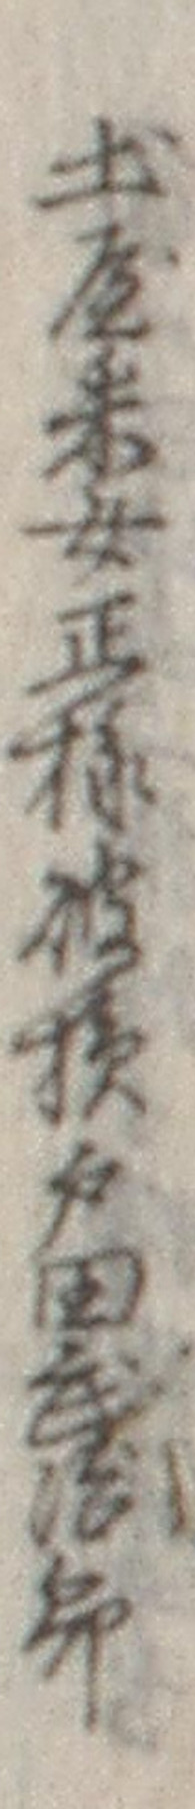土屋釆女正様破損戸田武治郎
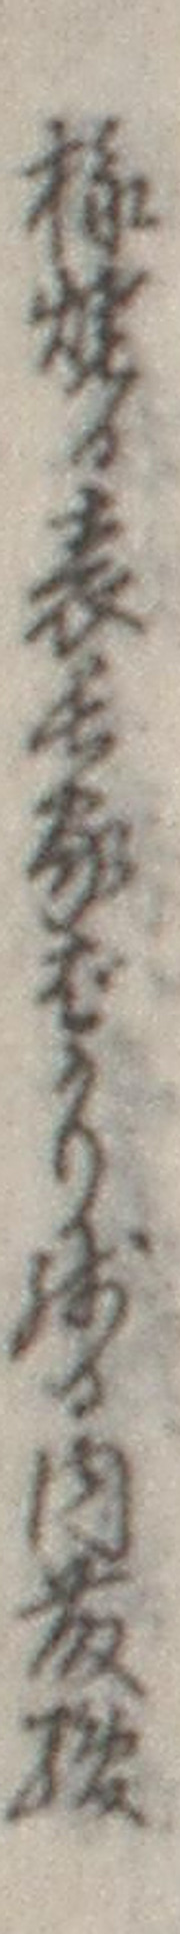様焼る表長家ばかり残る内藤駿

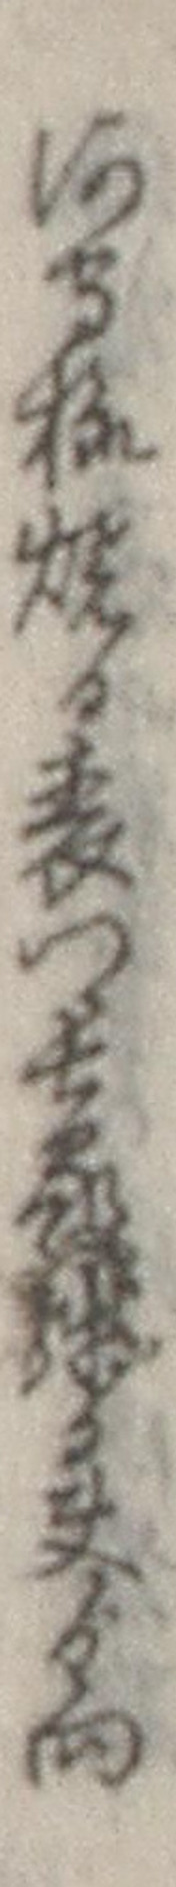河守様焼る表門長家残る夫ゟ向
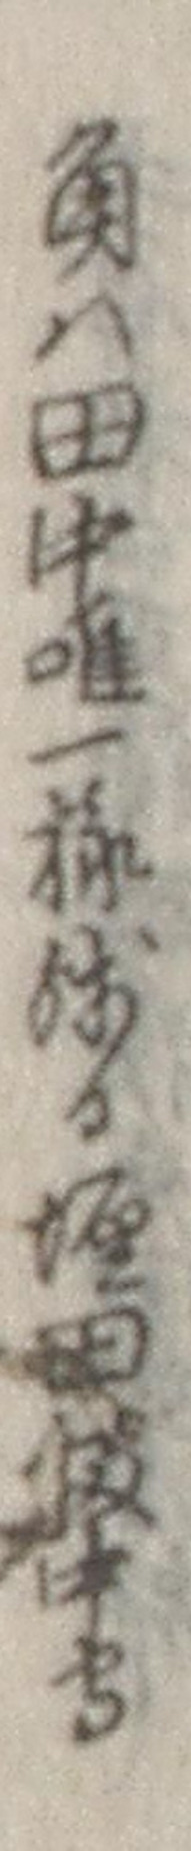奥ハ田中唯一様残る垣田備中守
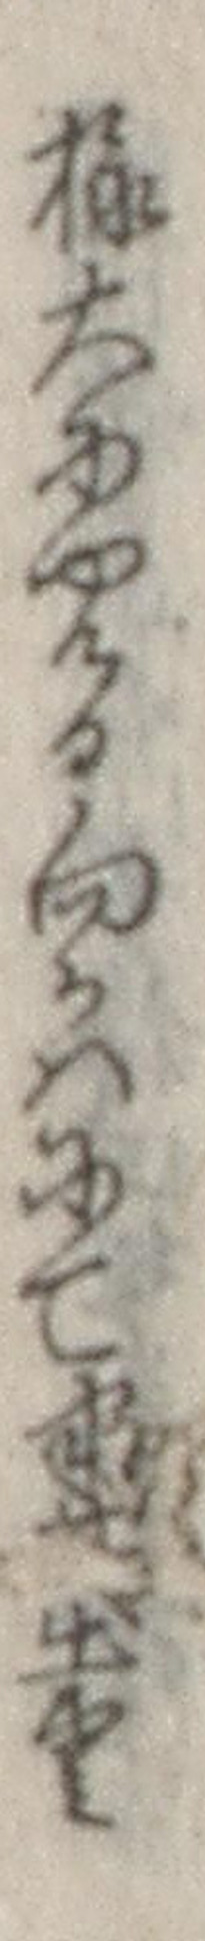様大にやける向かハにて出雲
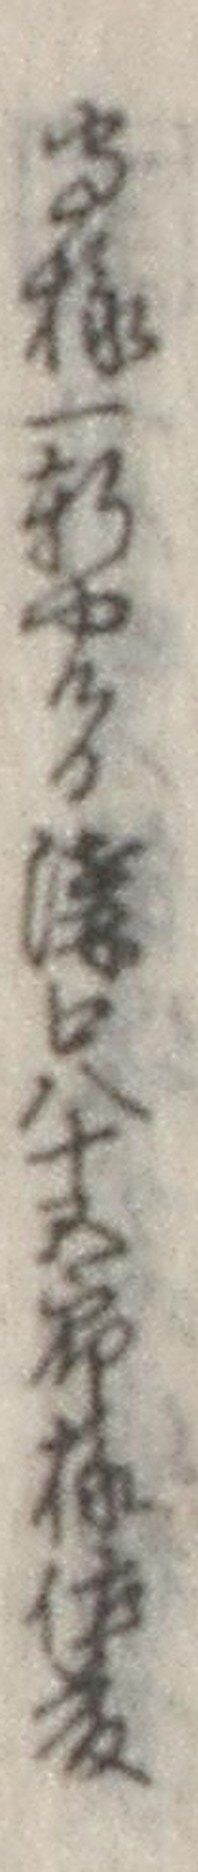守様一軒やける溝口八十五郎様佐藤
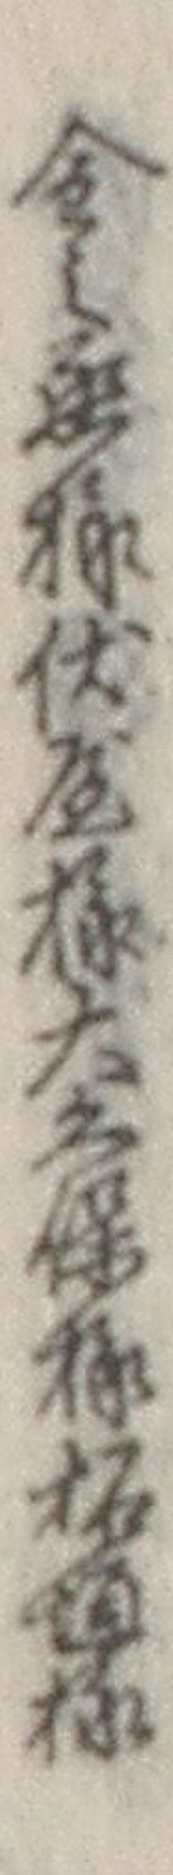金之丞様伏屋様大久保様柘植様
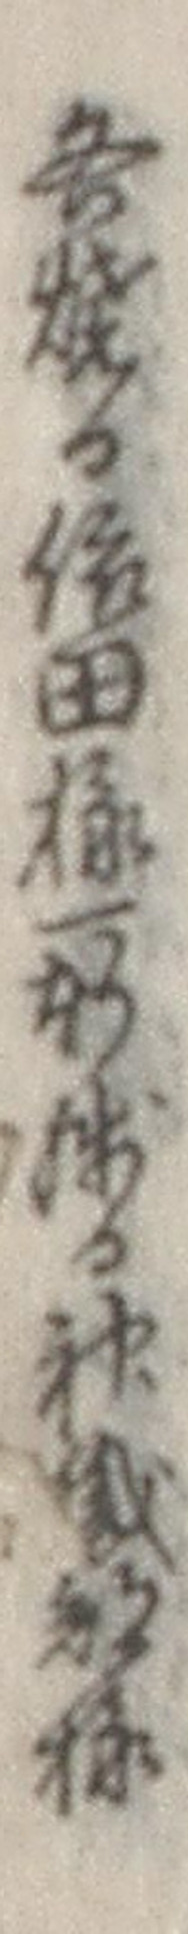各焼る依田様一軒残る神鐡部様
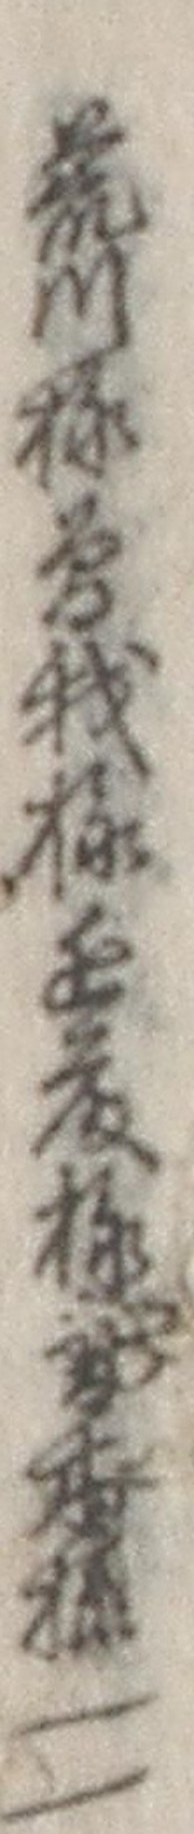荒川様曽我様遠藤様木様
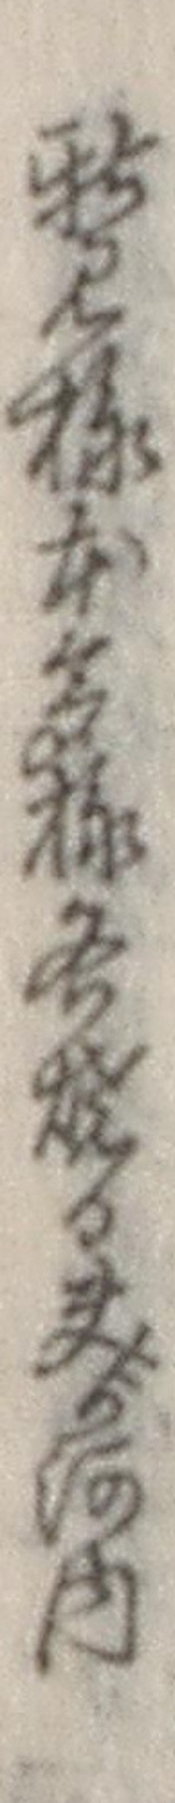新見様本多様各焼る夫ゟ河内
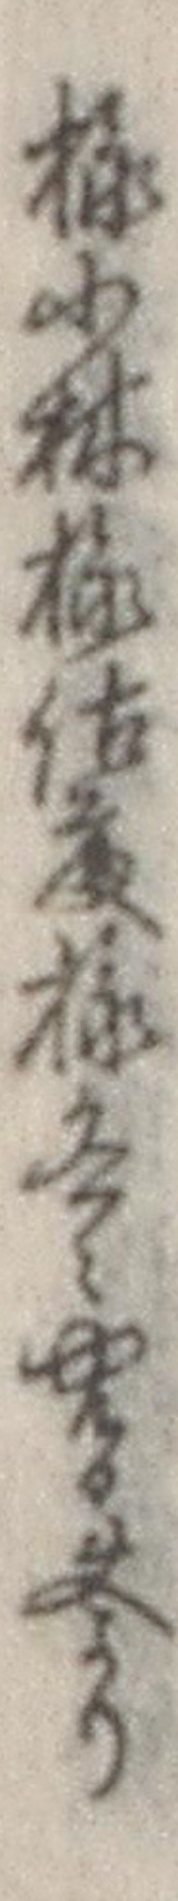様小林様佐藤様各〻やける夫より
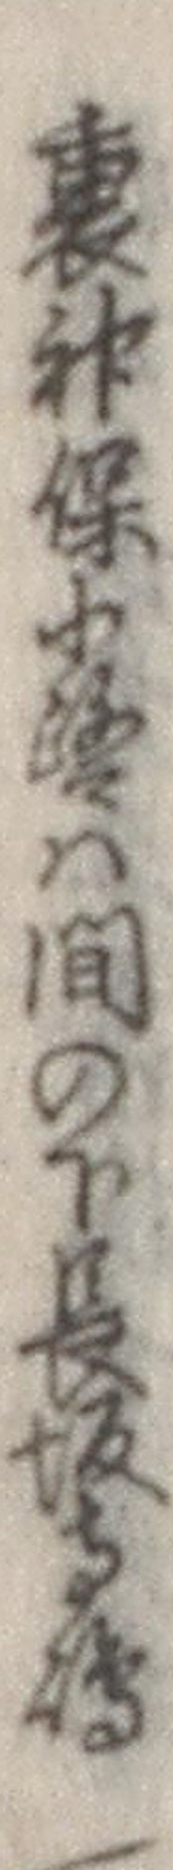裏神保小路は間の下長坂寺嶋
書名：江戸　大地震臣細録　全
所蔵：東京大学地震研究所図書室 Earthquake Research Institute Library, The University of Tokyo, JAPAN
